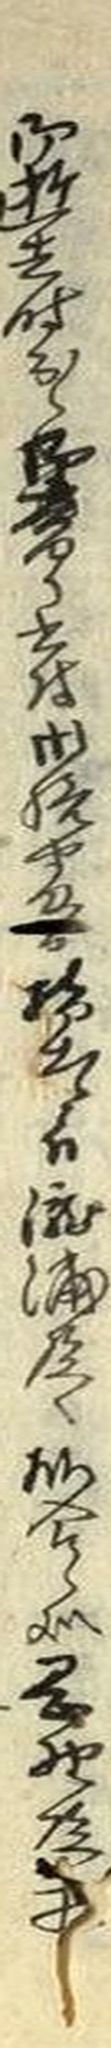御逝去時分之御預り書付御膳番ゟ指出候ニ付滝浦殿へ掛合候処岡野殿相
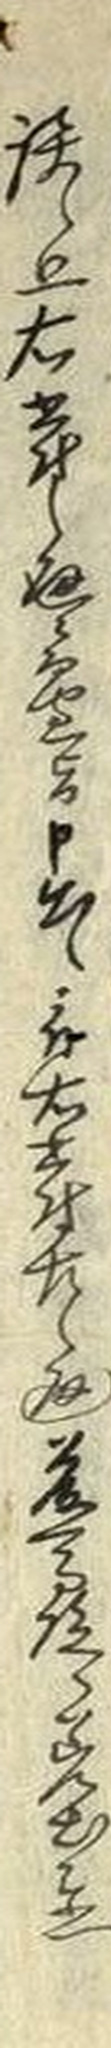談之上右書付之通ニ而宜旨申出候ニ付右書付左之通藤馬殿へ差出置
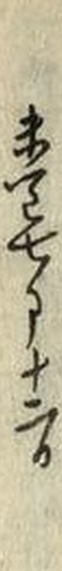未閏七月十二日
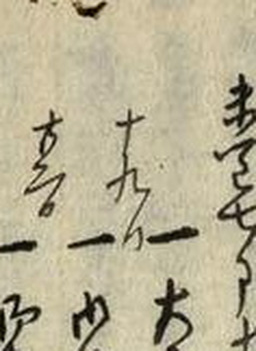十九日
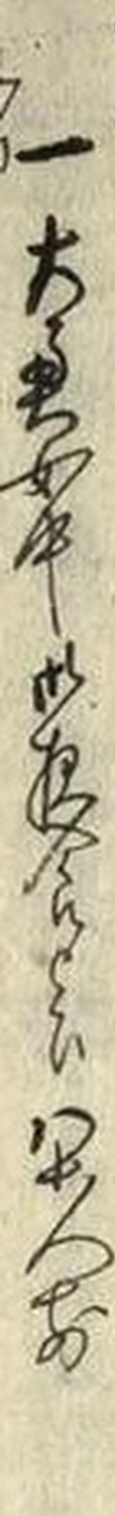一大奥女中御夜食被下八十人前
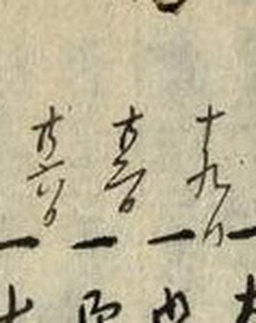廿二日
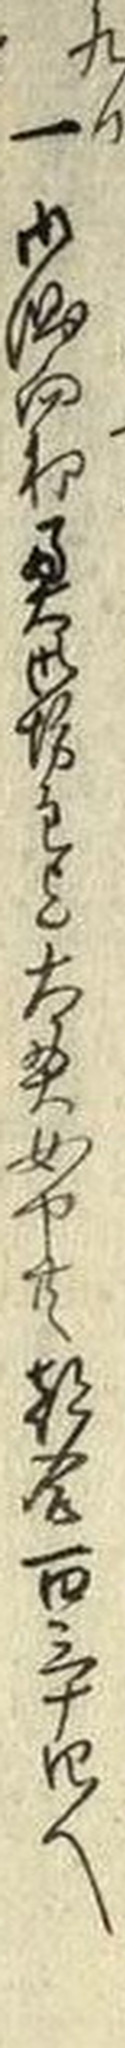一御側向初奥御坊主迄大奥女中共都合百三十四人
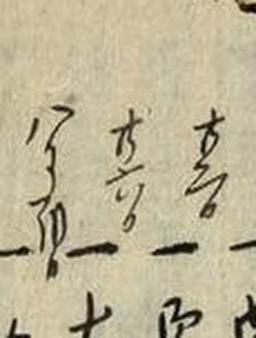廿六日
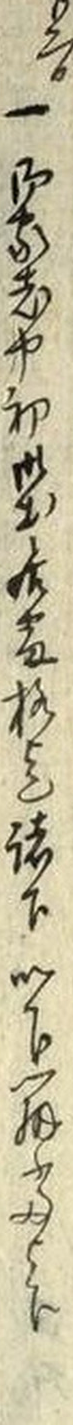一御家老中初御出居番格迄詰下以下弁当被下
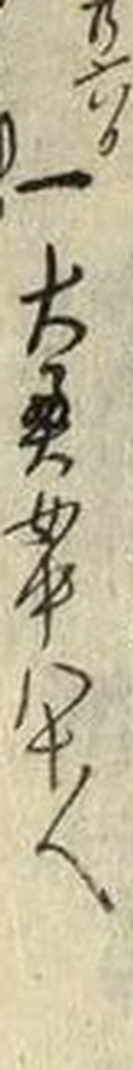一大奥女中八十人
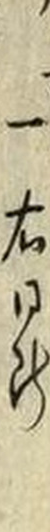一右同断
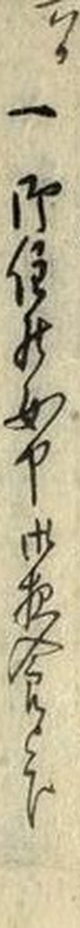一御住居女中御夜食被下

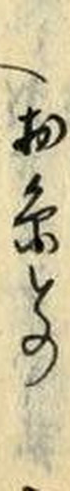お糸との
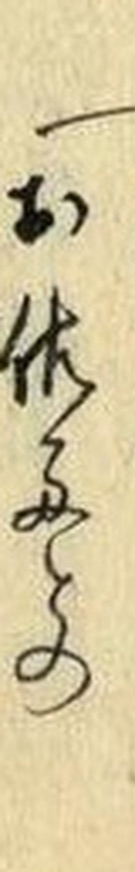おさたとの
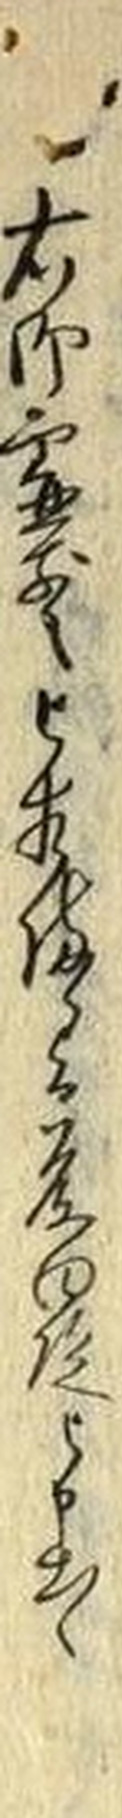右御霊前へ被相備候旨藤田殿被申出候
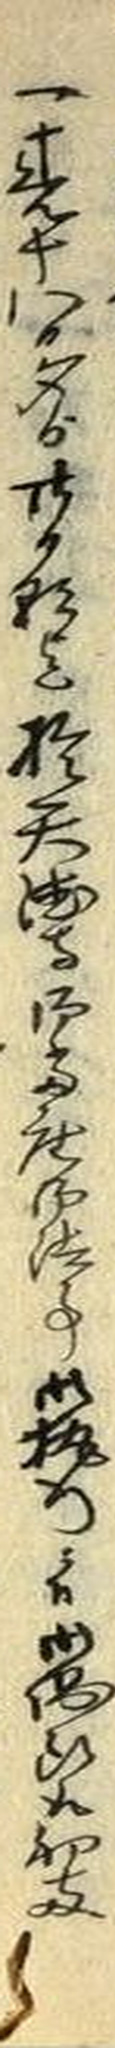一来ル十八日夕ゟ廿日朝まで於天徳寺御当座御法事御執行ニ付御側頭取初両
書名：少傅日録抄（斉善付側向頭取日記、江戸并道中、初入在国、逝去後…
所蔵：福井県文書館 Fukui Prefectural Archives
